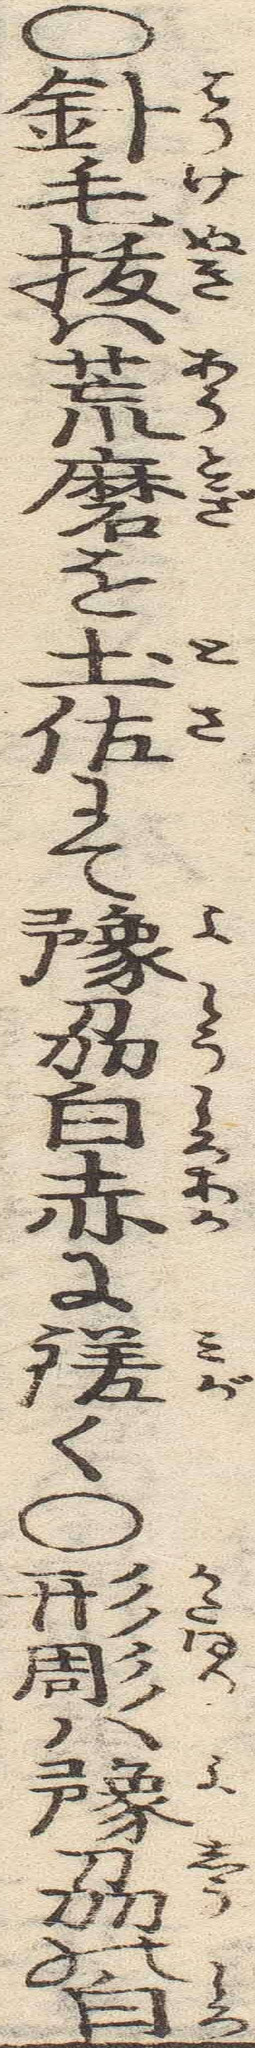○針毛抜は荒磨を土佐にて予州白赤に鎈く○形彫は予州の白
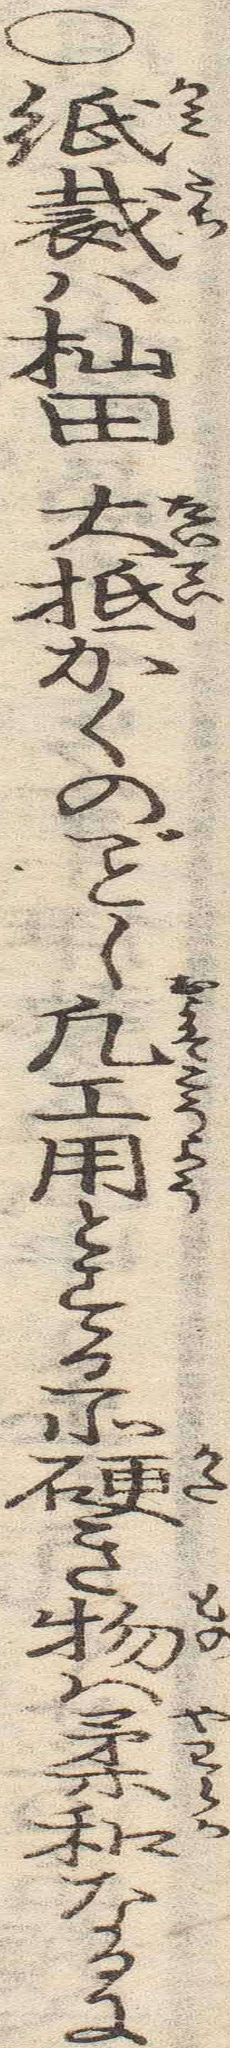○紙裁は杣田大抵かくのごとし凡工用とする所硬き物は柔和なるに
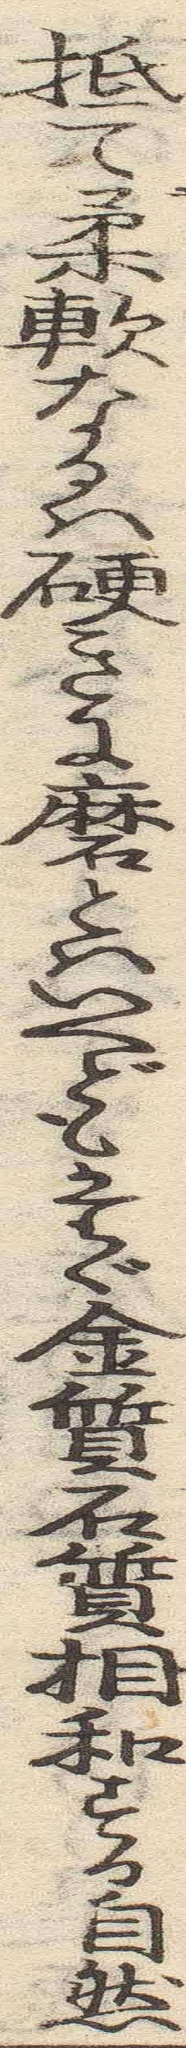抵て柔軟なるは硬きに磨とはいへどもたゞ金質石質相和する自然
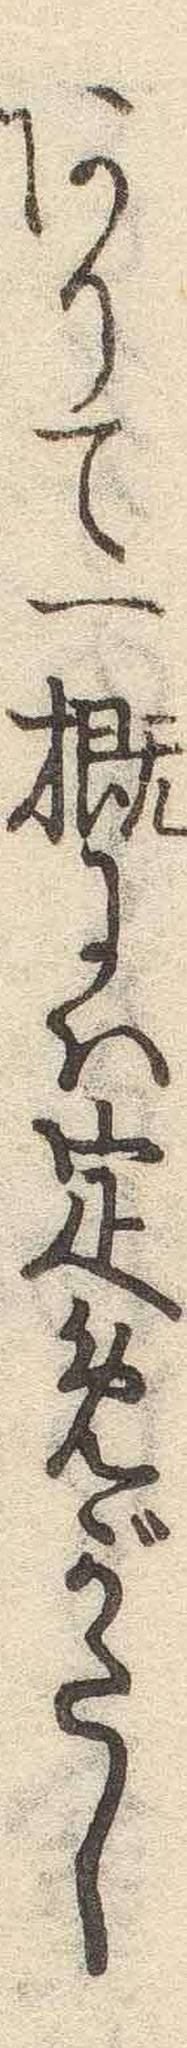ありて一概には定めがたし
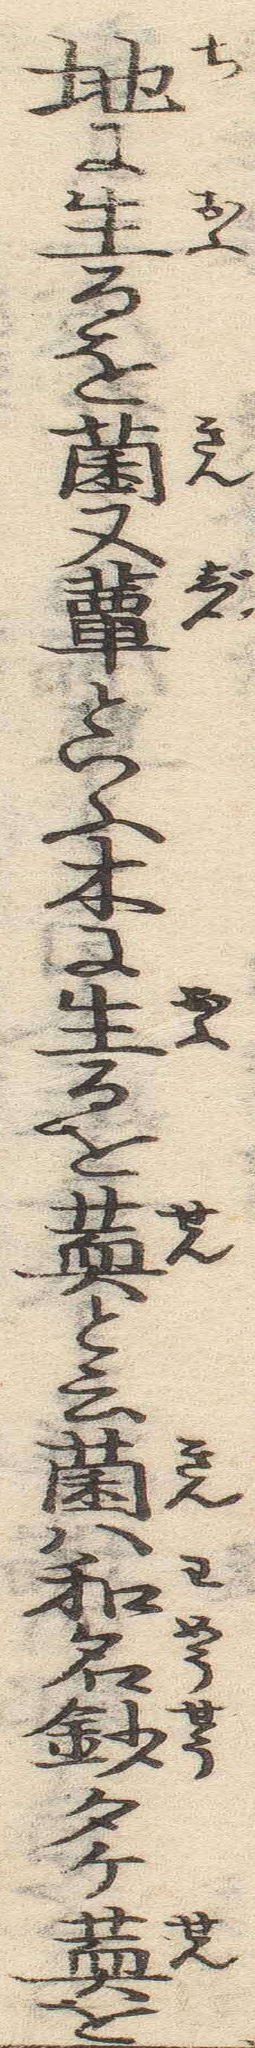地に生るを菌又蕈といふ木に生るを䓴と云菌は和名鈔タケ䓴を
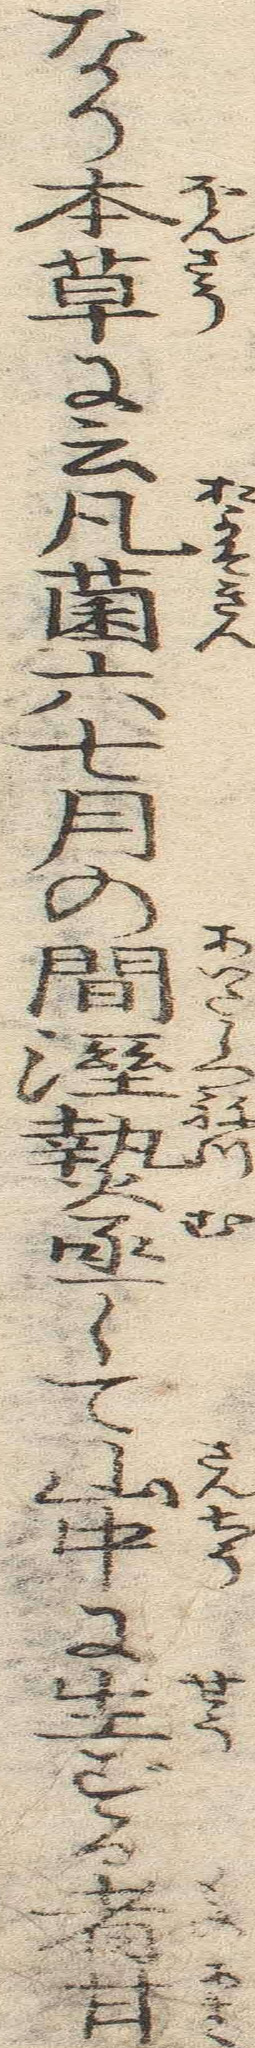なり本草に云凡菌六七月の間湿熱蒸して山中に生ずる者甘
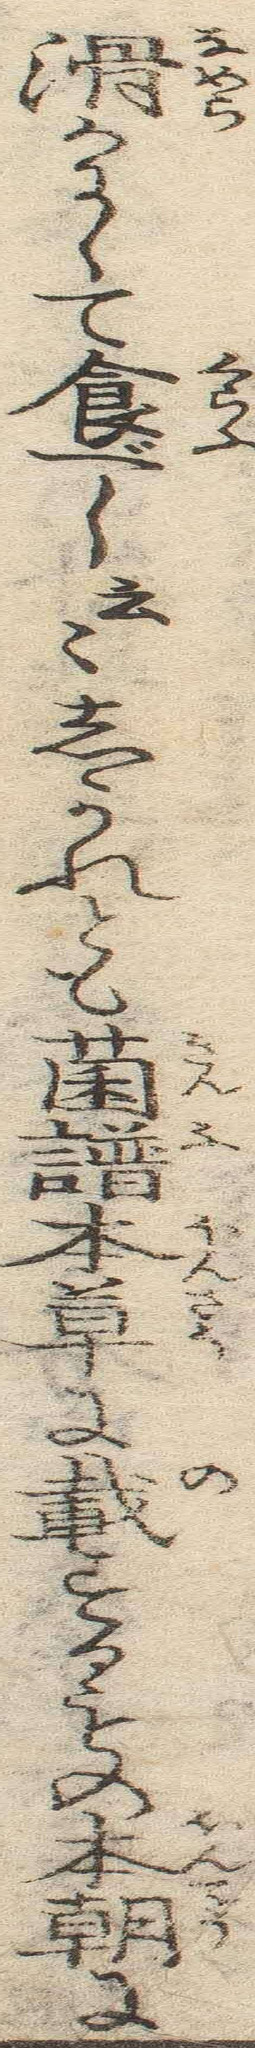滑かにして食べし云々しかれとも菌譜本草に載するもの本朝に
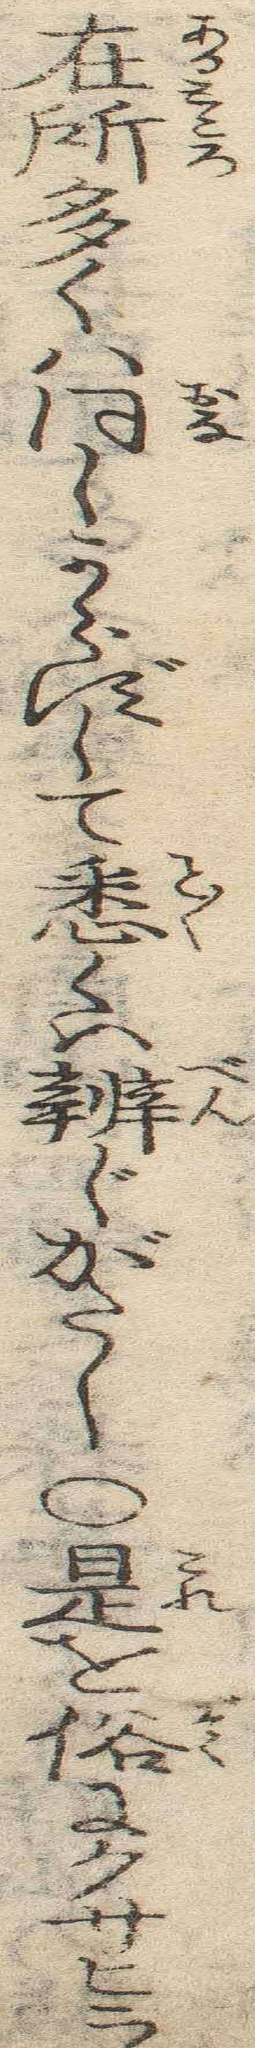在所多くは同しからずして悉くは弁じがたし○是を俗にクサヒラ
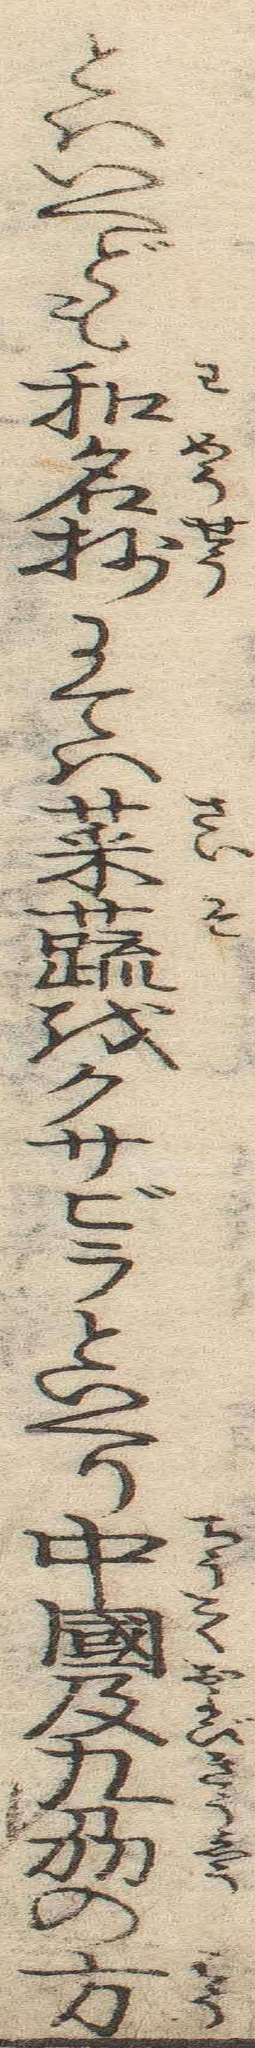とはいへども和名抄にては菜蔬をクサビラといへり中国及九州の方
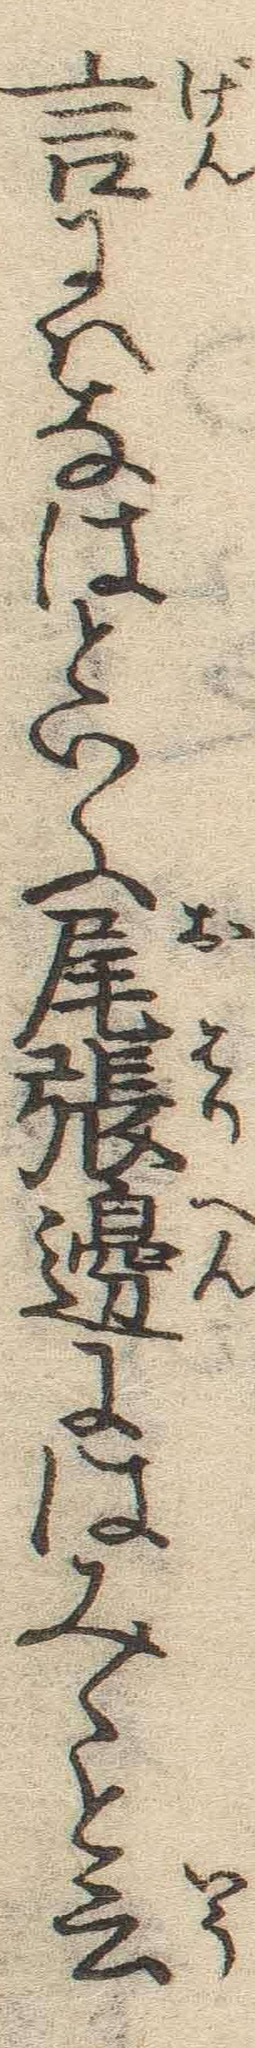言にはなはといふ尾張辺にはみゝと云

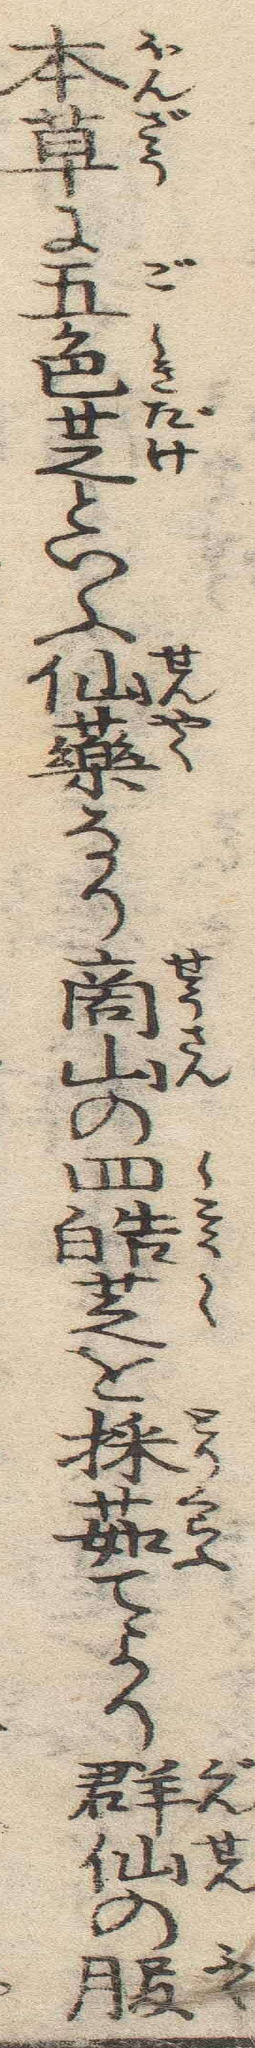本草に五色芝といふ仙薬なり商山の四皓芝を採茹てより群仙の服
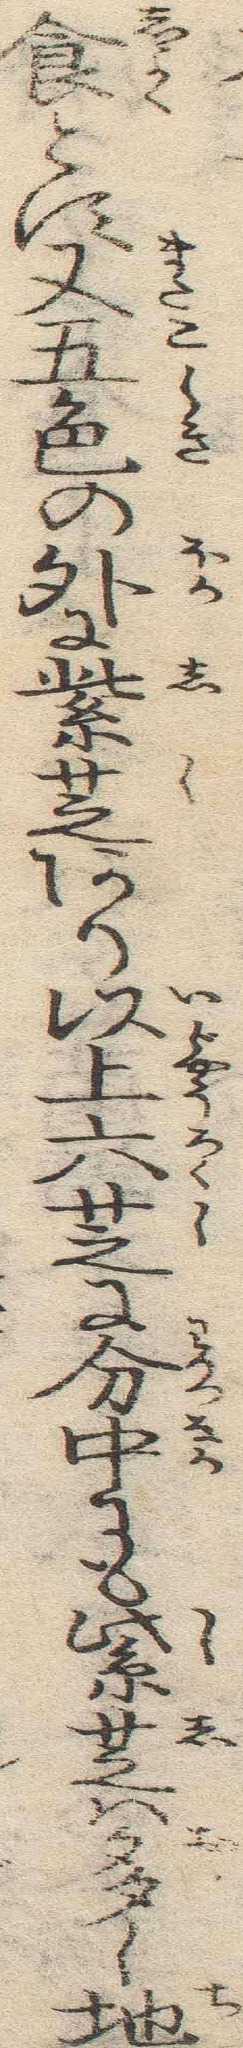食とす又五色の外に紫芝あり以上六芝に分中にも紫芝は多し地
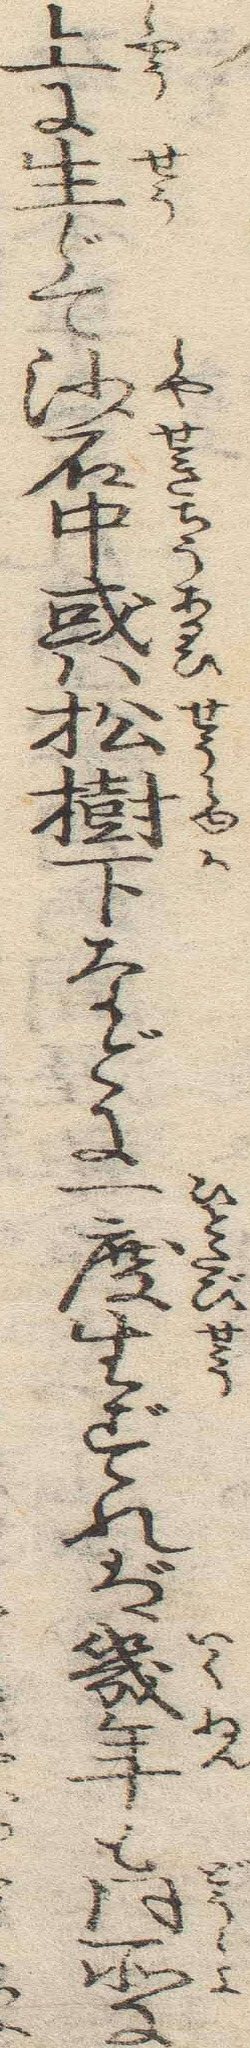上に生じて沙石中或は松樹下などに一度生ずれば幾年も同所に
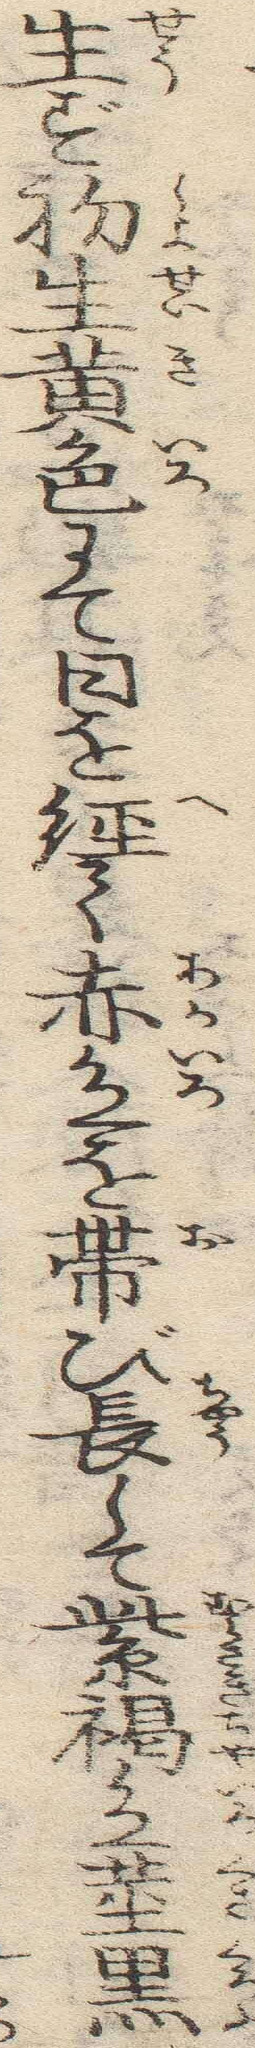生ず初生黄色にて日を経て赤色を帯び長して紫褐色茎黒
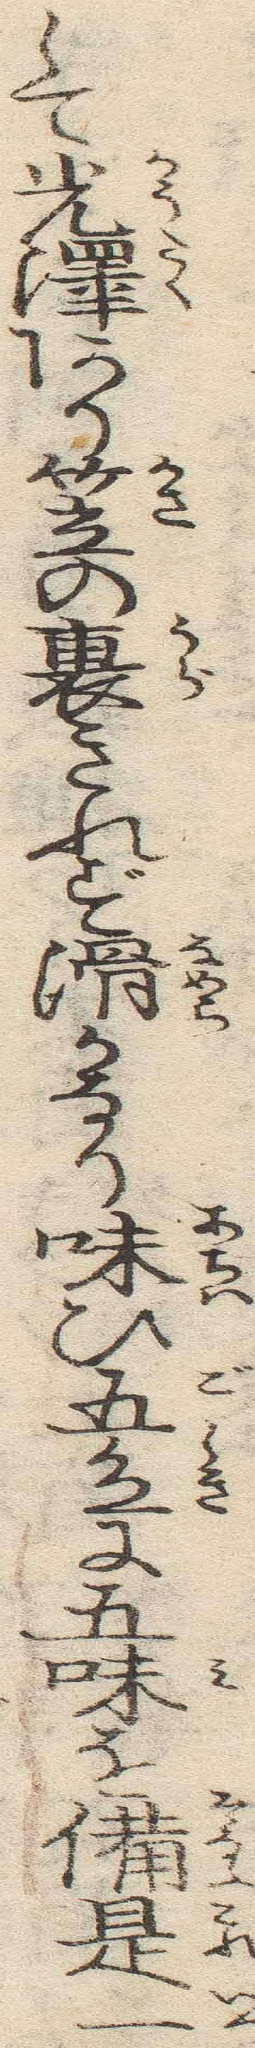して光沢あり笠の裏きれず滑かなり味ひ五色に五味を備是一
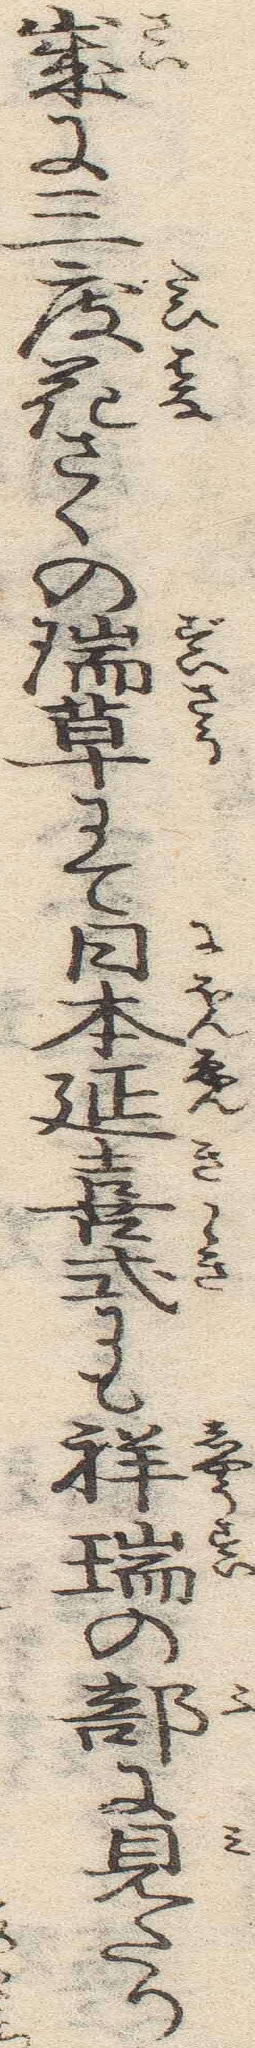歳に三度花さくの瑞草にて日本延喜式にも祥瑞の部に見たり
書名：日本山海名産図会
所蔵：東京学芸大学附属図書館 国文学研究資料館
